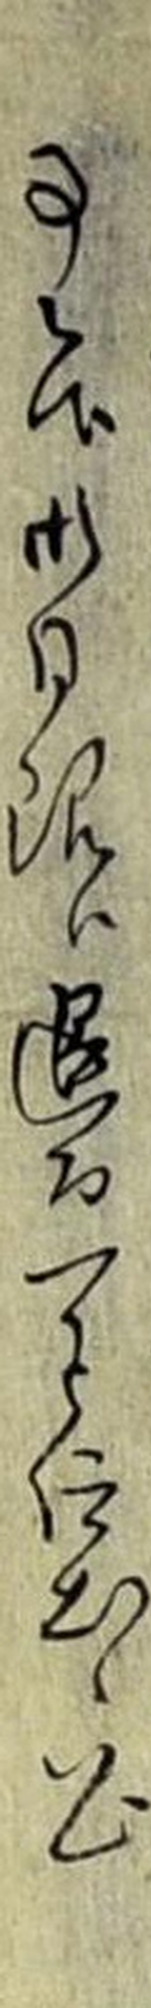事ニ候御日限ハ追而可被仰出候以上
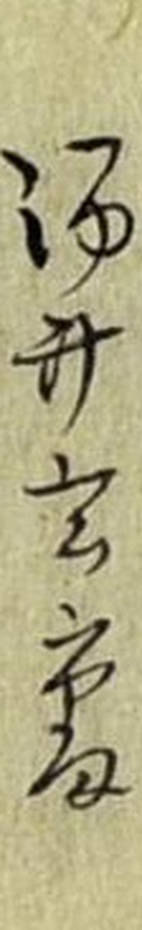酒井玄蕃
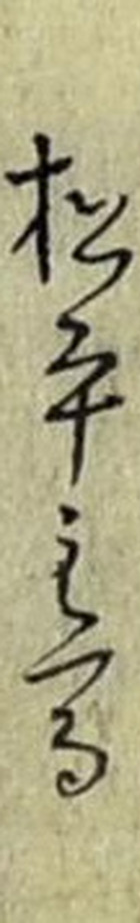松平主馬
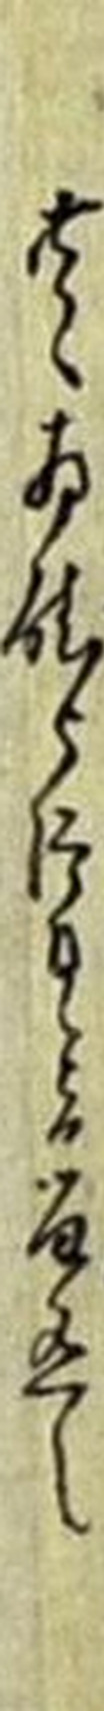共へ拝聴被仰付候胸留有之
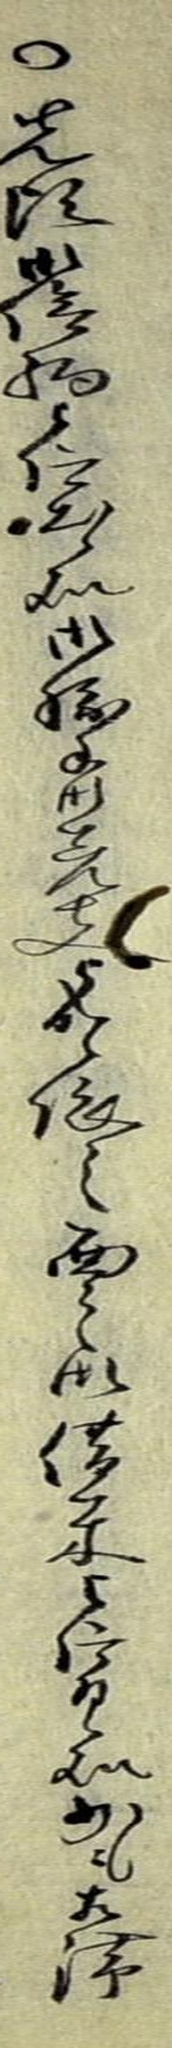〇先頃御倹約被仰出候処御勝手御差支被成候依之面々へ御借米被仰付候処少も相滞
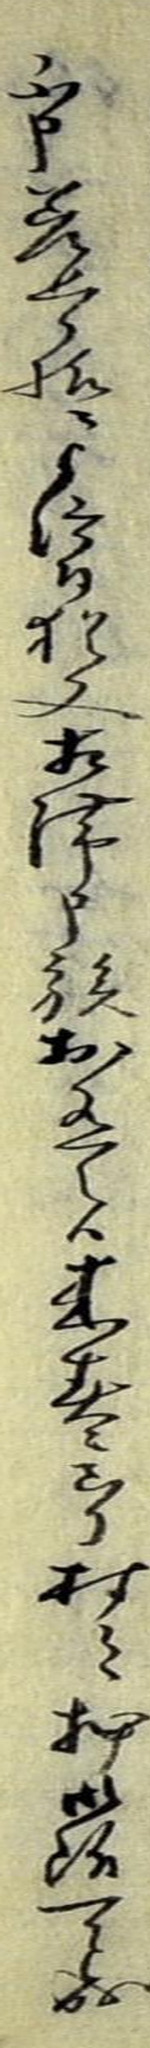不申差上候様ニ被仰付猶又相滞申族於有之ハ来春ニ至り村々へ押御付可被成

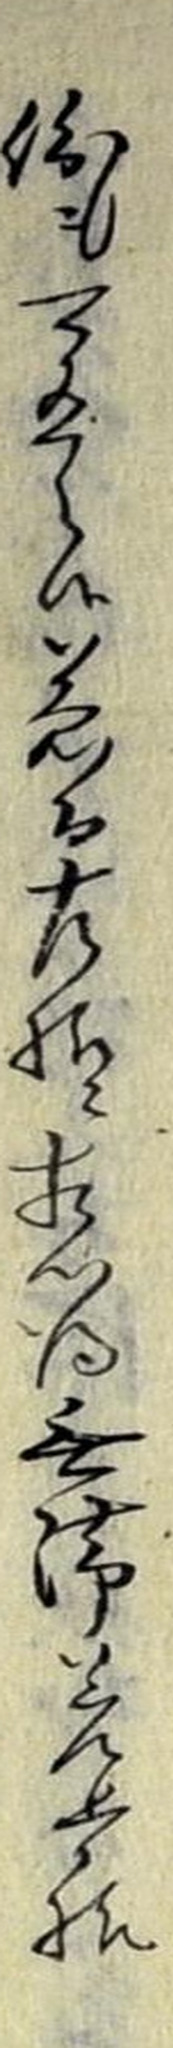儀も可有之候兼而左様ニ相心得無滞差上候様
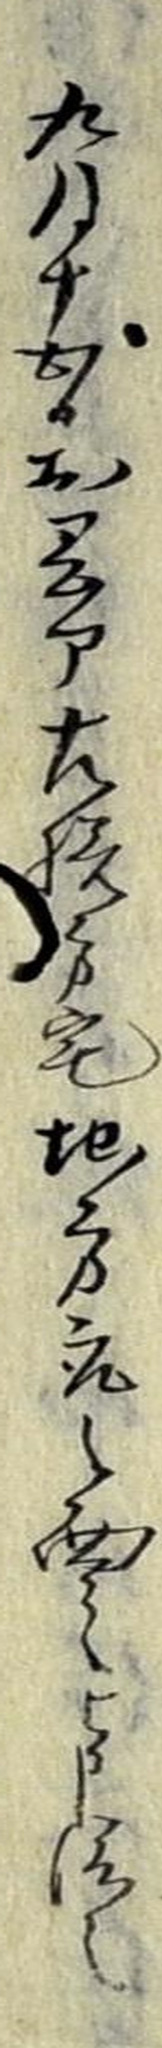九月十五日於岡部左膳方宅地方取之面々へ被申渡之
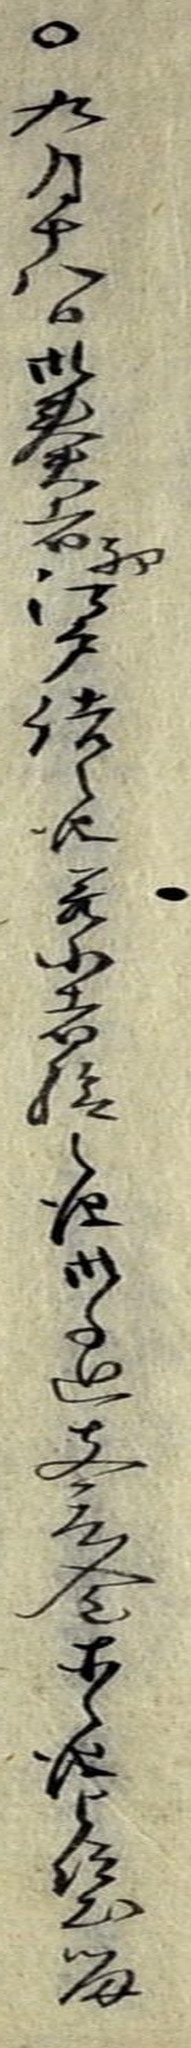〇九月十八日御奏者初江戸詰之儀并小者給之儀御手廻支度金等之儀被仰出留
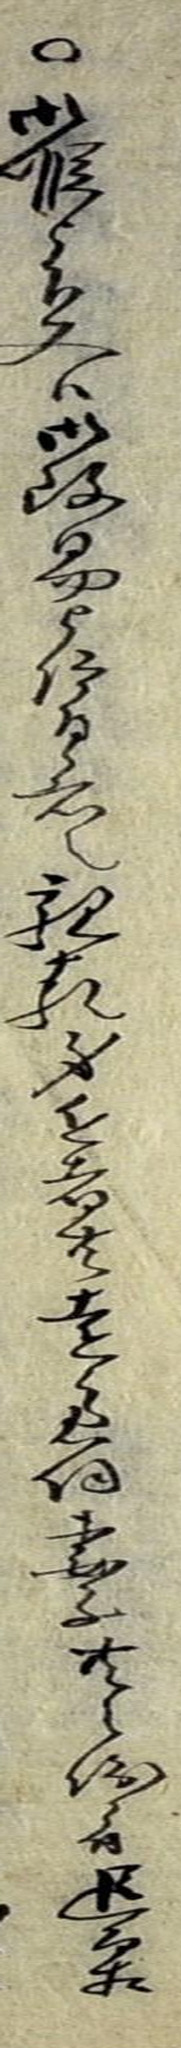〇御暇被下又ハ御改易被仰付候者之親類身近者共遠慮伺妻子共之儀ニ付追而相
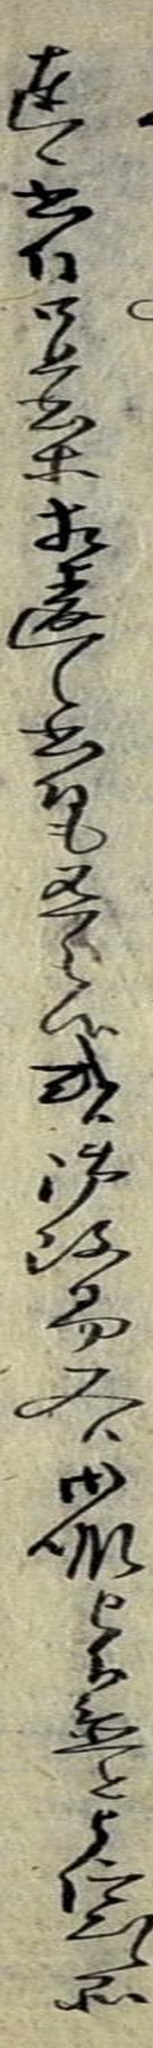達候書付口上書等相違之書付も有之候或ハ御改易又ハ御暇被下置と被仰出候品
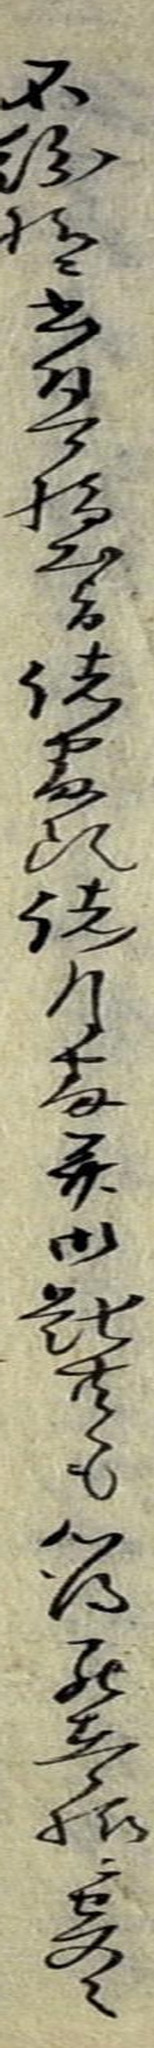不紛様ニ書付可指出旨諸番頭諸月番并御匙共へも心得罷在候様ニ寄々
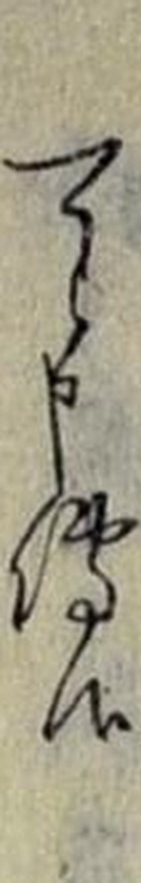可被申伝候
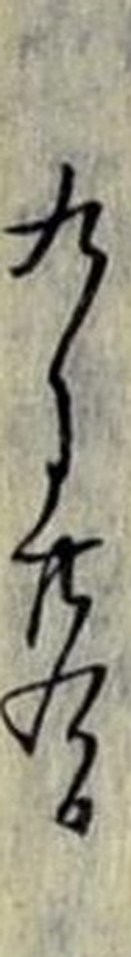九月廿九日
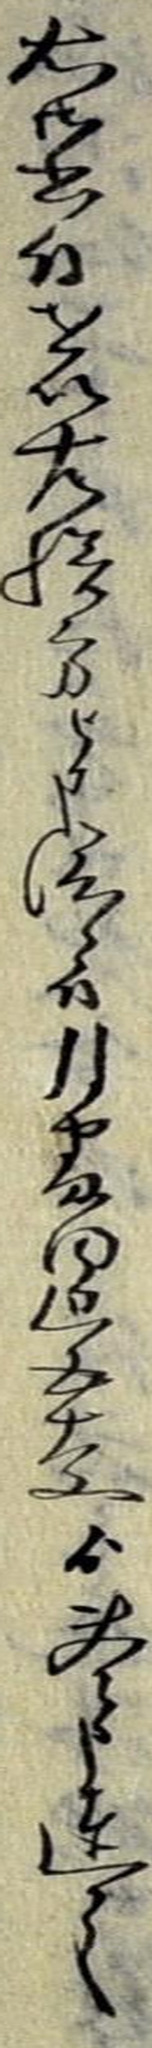右御書付を以左膳方被申渡候ニ付月番田辺五大夫ゟ夫々へ申達之
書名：命令之部 一
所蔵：福井県文書館 Fukui Prefectural Archives
